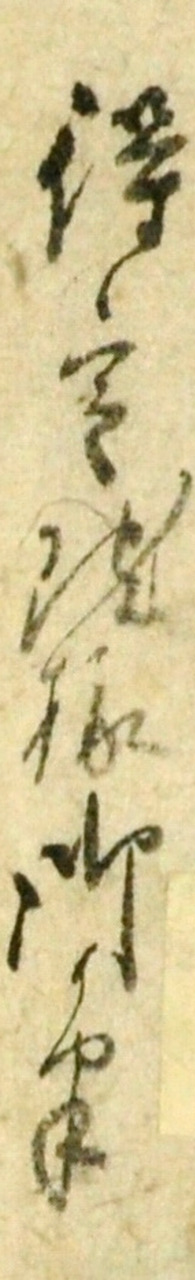得定院様御筆
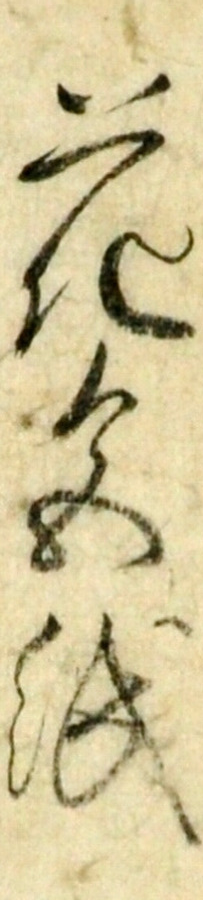花色紙

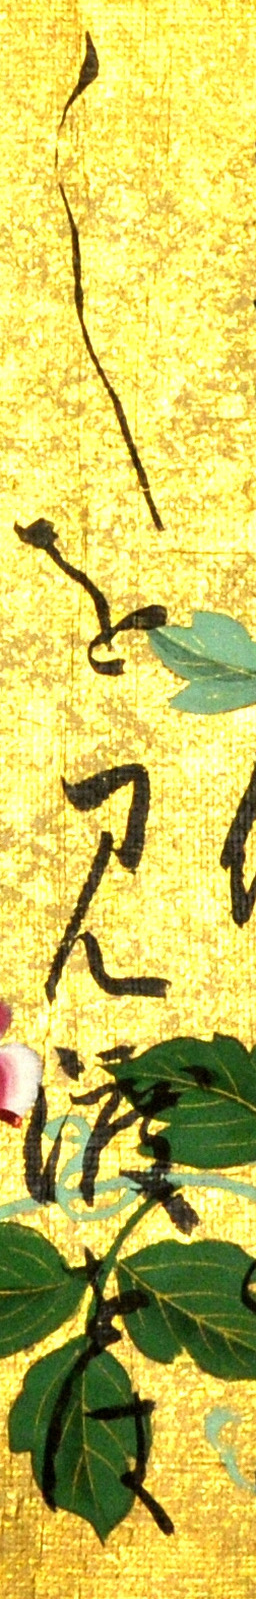しを見渡せは
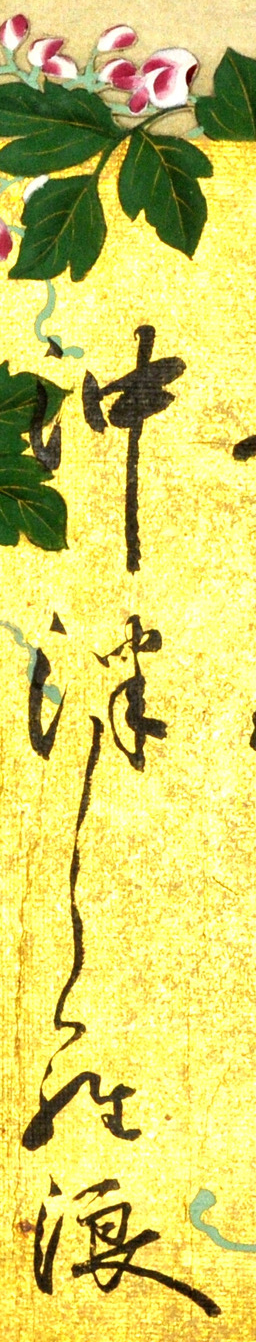沖つしら波
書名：花色紙
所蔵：伊那市立高遠町図書館・合同会社AMANE
